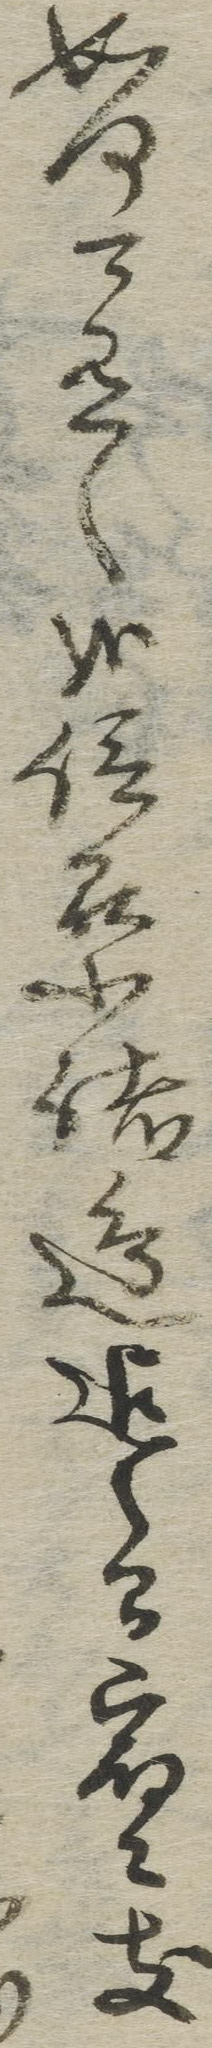如何可有之哉信州小諸辺迄之間宿々支
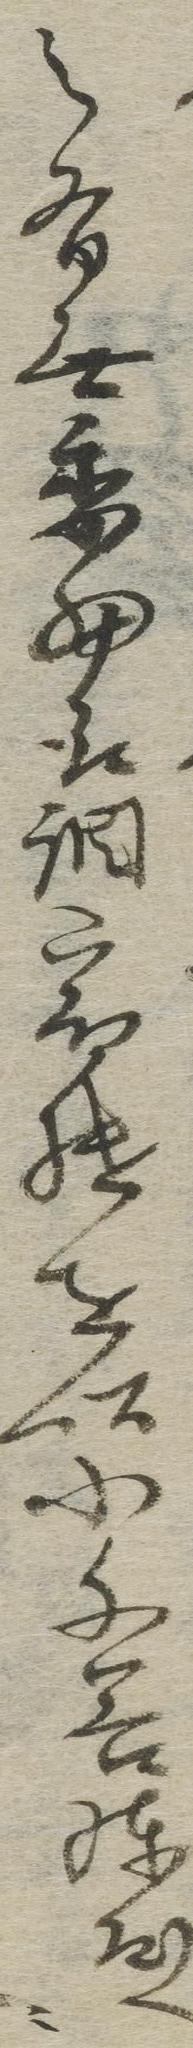之有無委細取調宿継を以小千谷陣屋へ
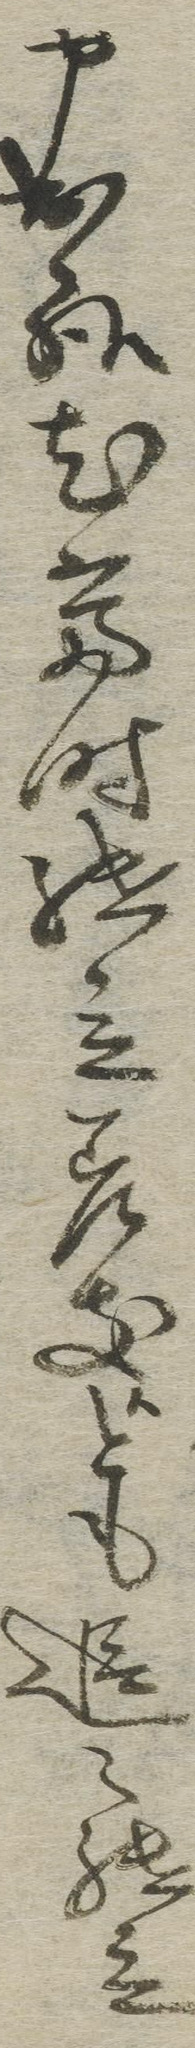申出候様尤当時継立差支候とも追々継立二
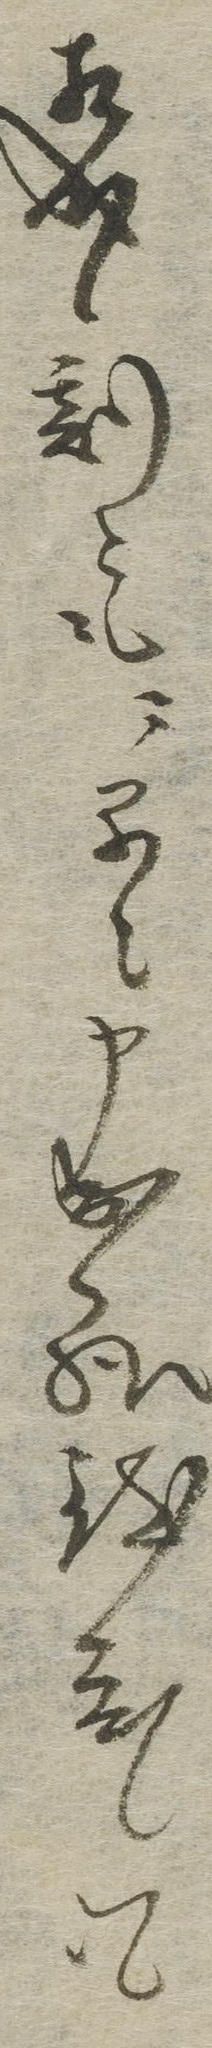相成候刻とも二早々申出候様致置候以上
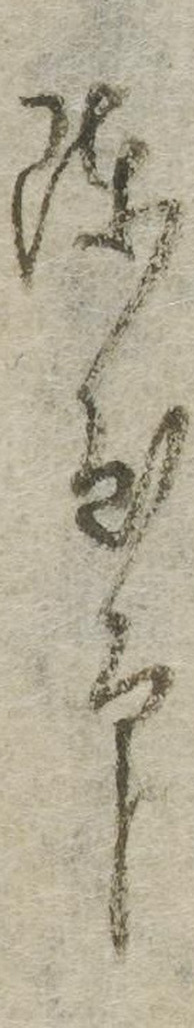陣屋印
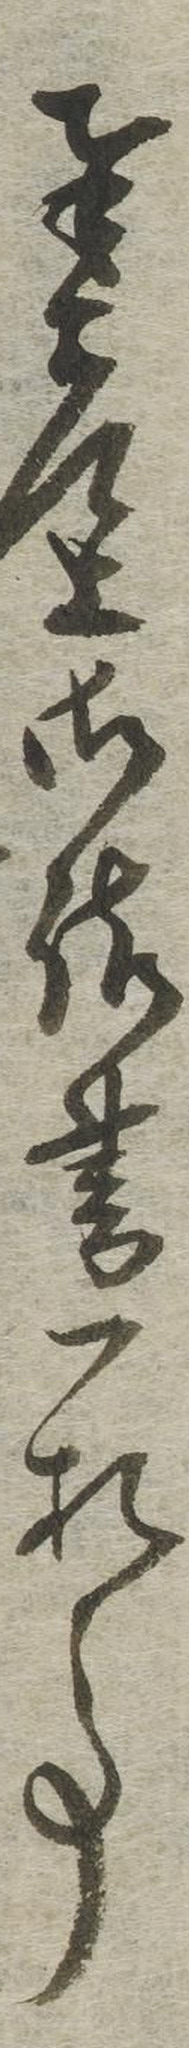奉差上御請書一札之事
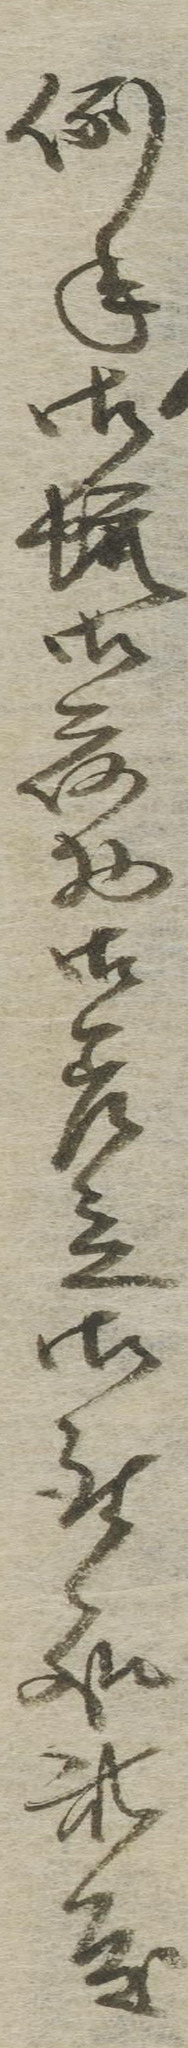一例年御蝋御荷物御差立御座候処此の度

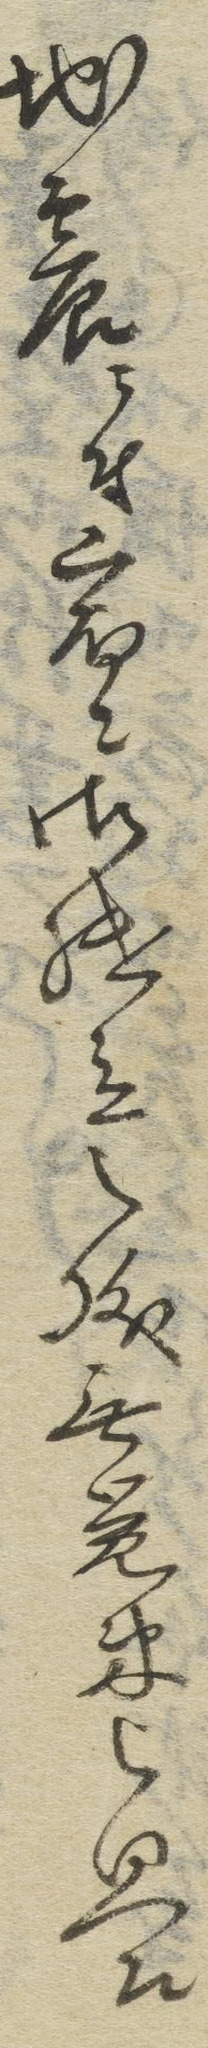地震二付宿々御継立之儀無覚束被思召
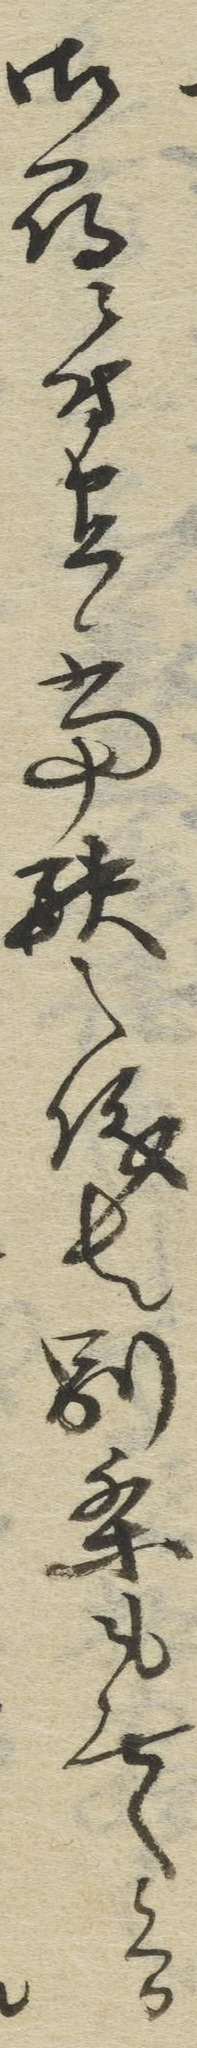御尋二付申上候当駅の儀は別条も無之候間
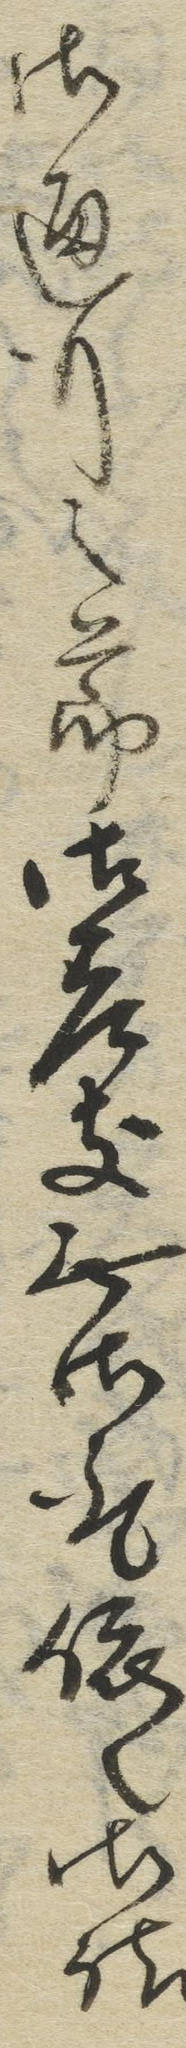御通行之節御差支無御座候依之御請
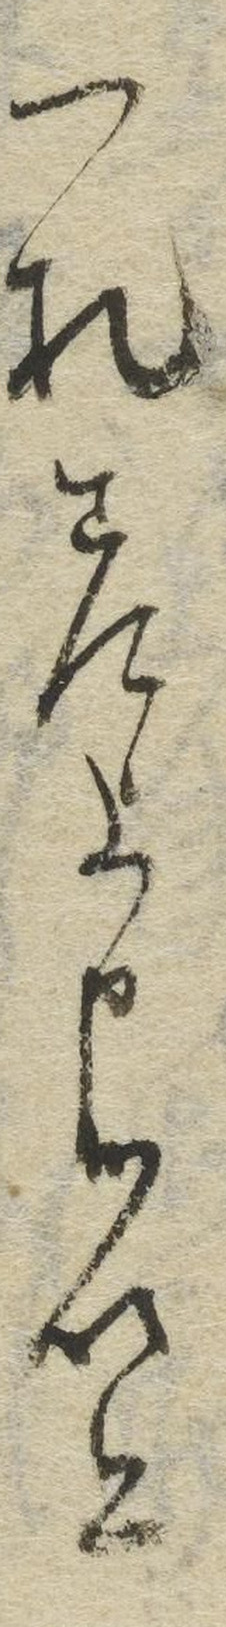一札差上申候以上
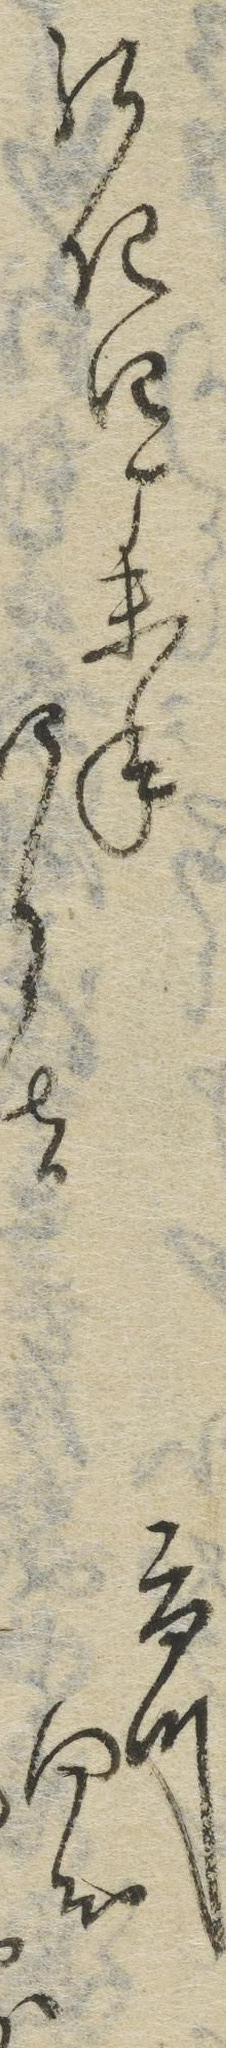弘化四丁未年小諸駅
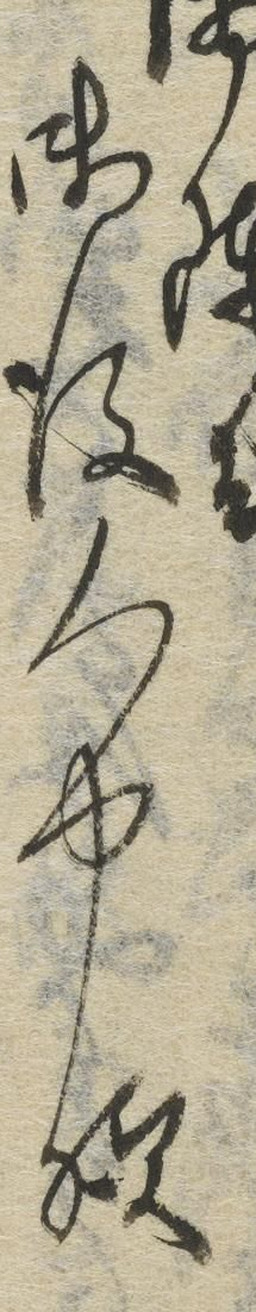御役人中様
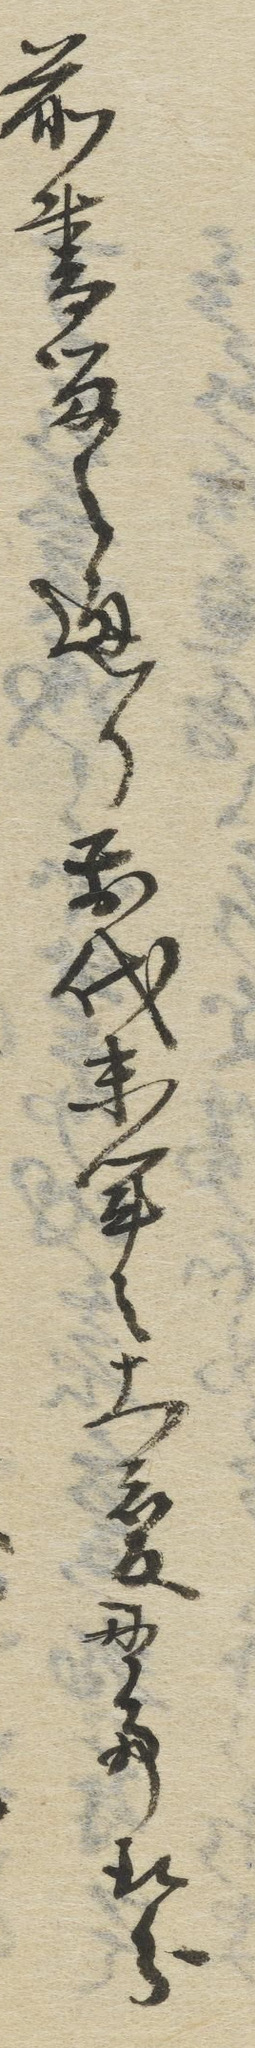前書留候通り前代未聞之大変にて取分
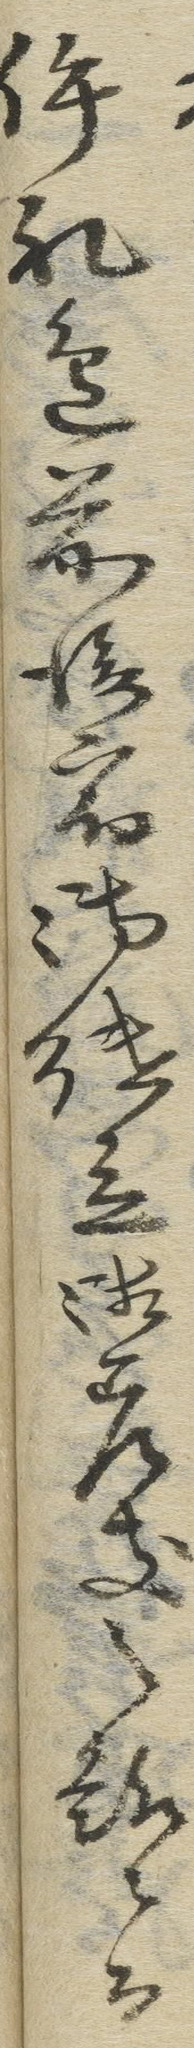侔礼辺前後宿御継立御差支之趣二而
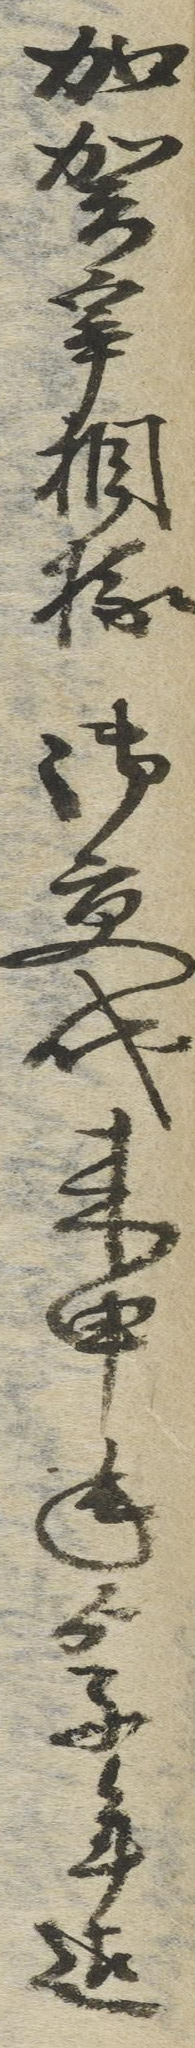加賀宰相様御交代来申年ゟ子年迄
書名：信濃越後　地震書留
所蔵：東京大学地震研究所図書室 Earthquake Research Institute Library, The University of Tokyo, JAPAN
